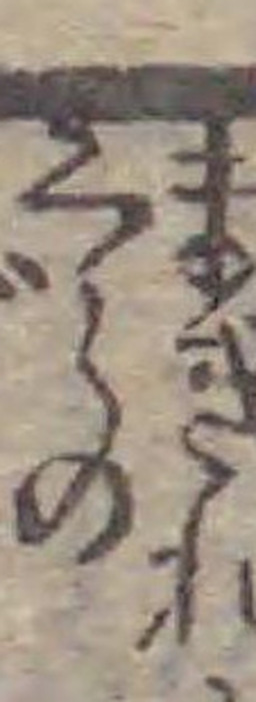くらの
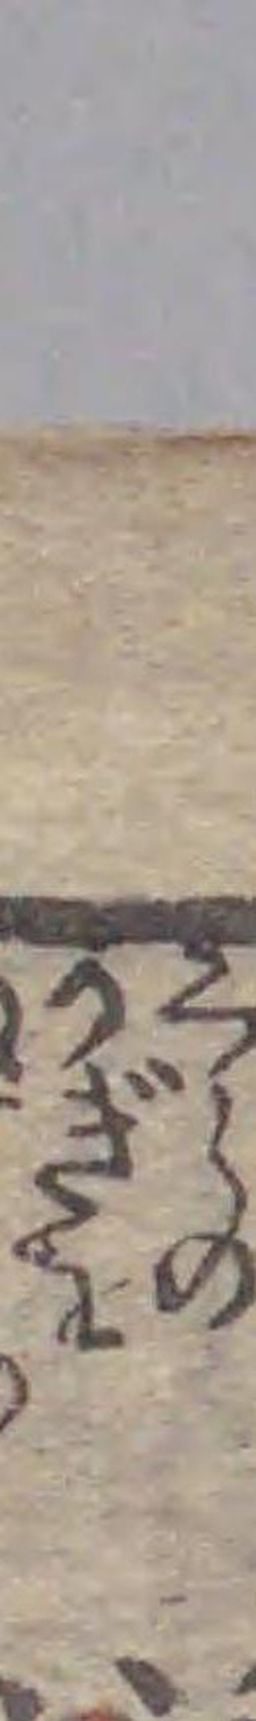かぎを
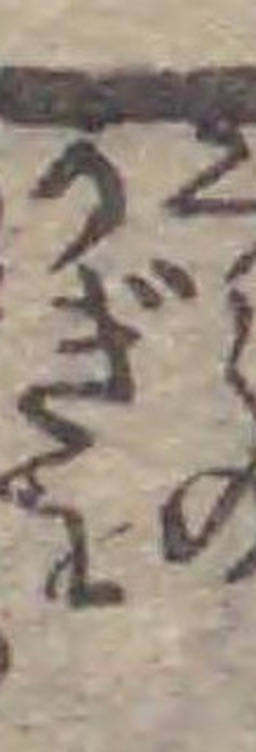かぎを
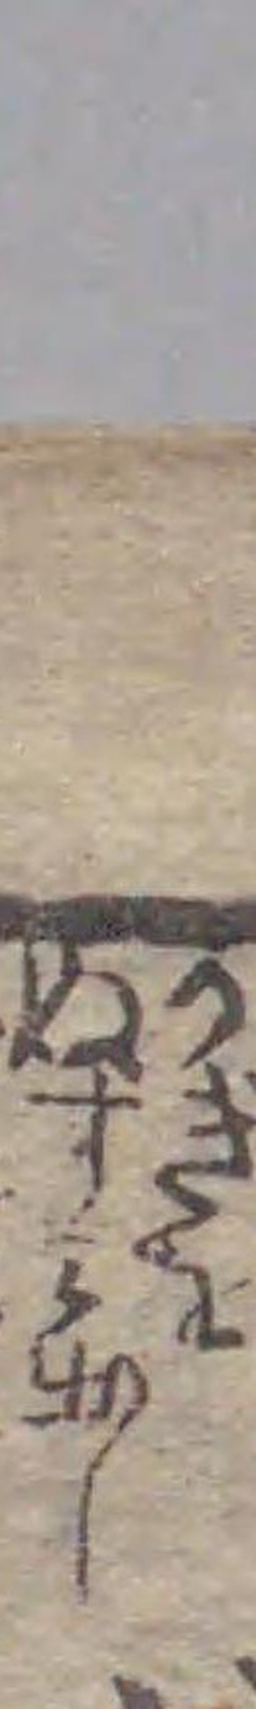ぬすみ出し
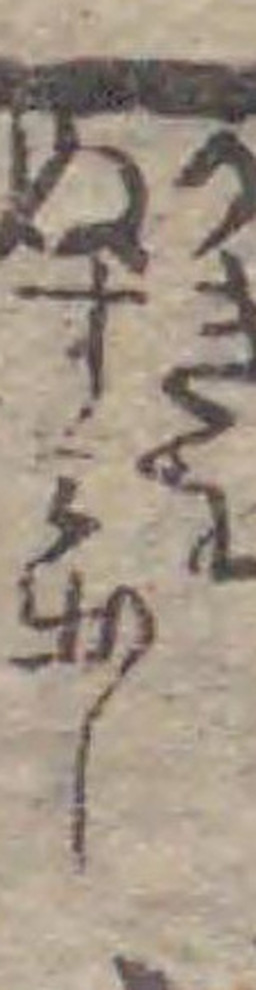ぬすみ出し
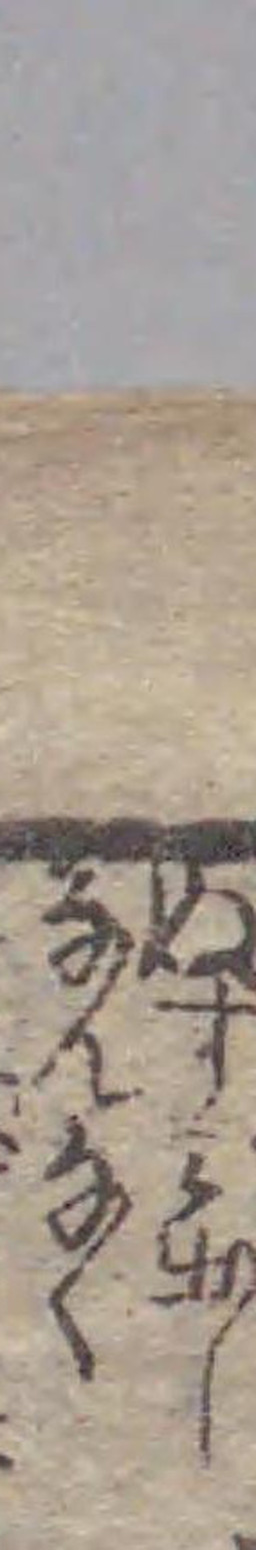なんなく
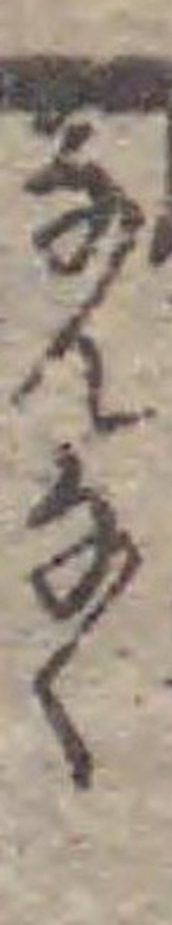なんなく
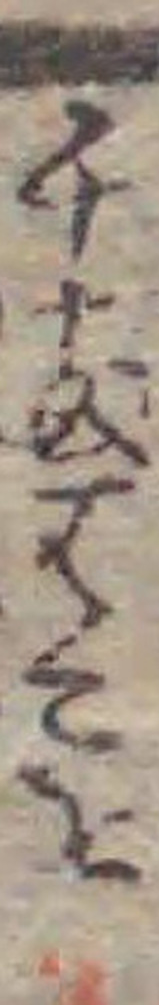千両はこを
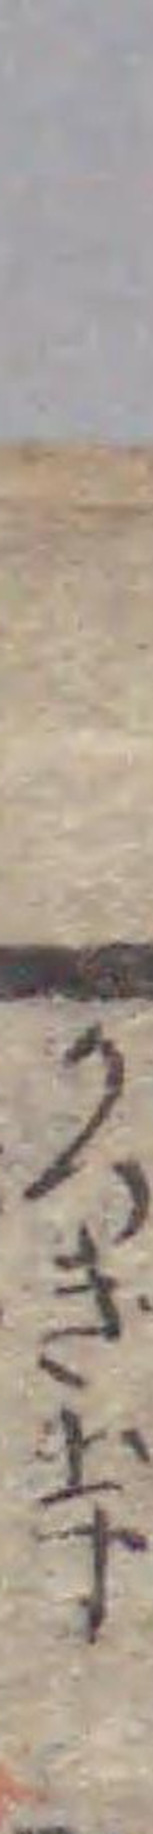かつぎ出す
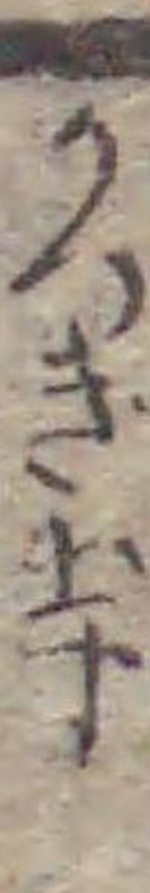かつぎ出す
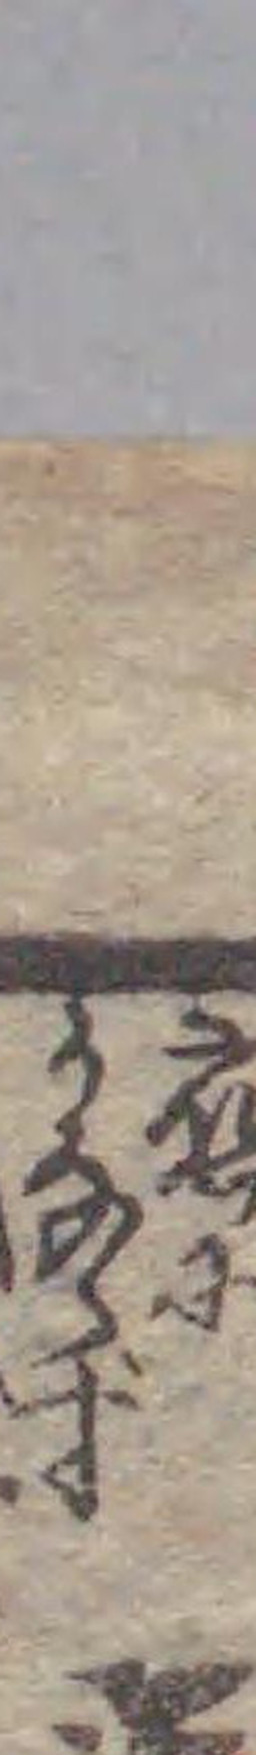かならず
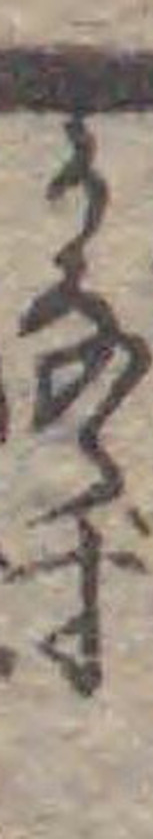かならず
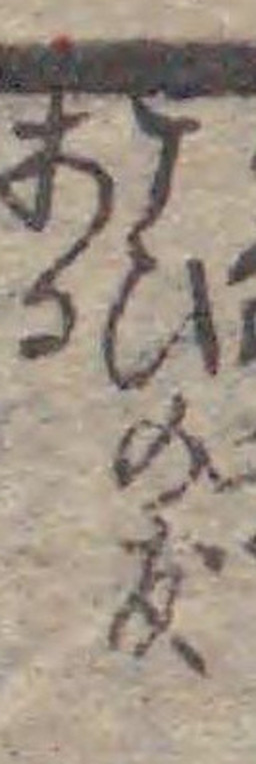こひの友
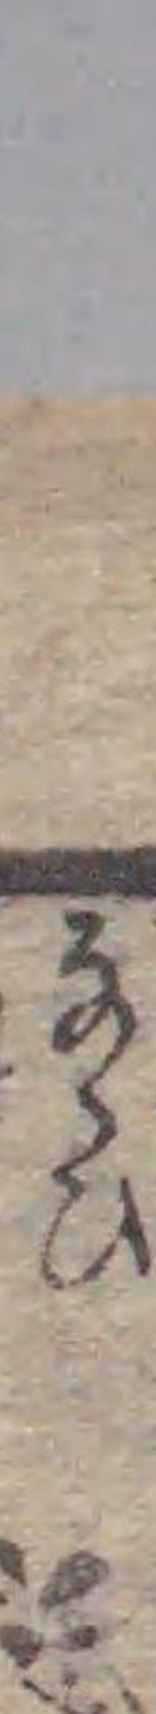ならひ
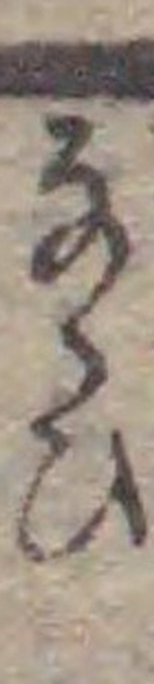ならひ
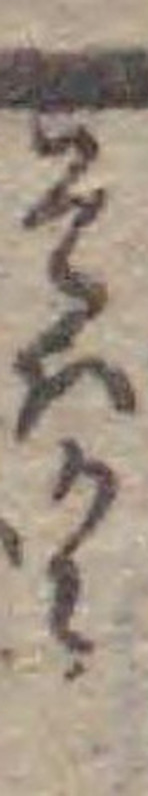そはから
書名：四遍搨心学草帋 : 3巻
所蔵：国立国会図書館 National Diet Library, JAPAN
